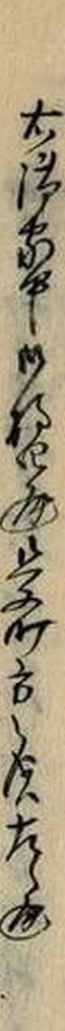右御家中御触四通且又町方之儀は左之通
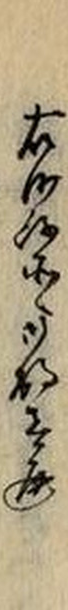右町役所へ御触壱通
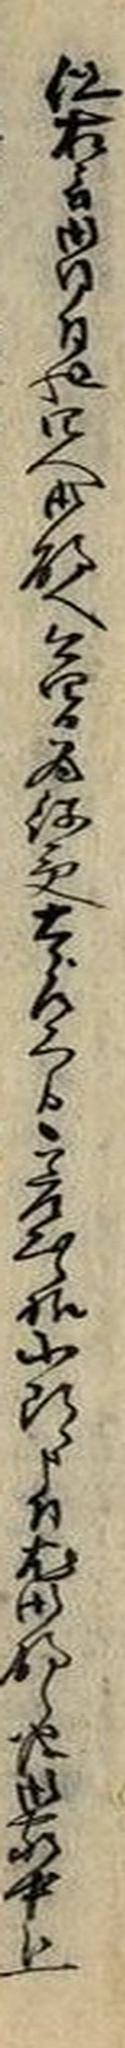但右に付御目付組四人御触人今四日為役受太郎左衛門方へ差出候様小頭へ申付尤御触之儀御家中上
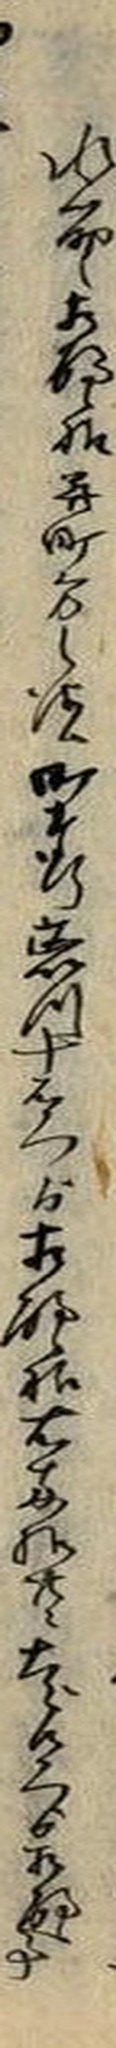水筋へ相触候様并町方之儀は町奉行荒川十右衛門ゟ相触候様右両様共に太郎左衛門ゟ相触候事
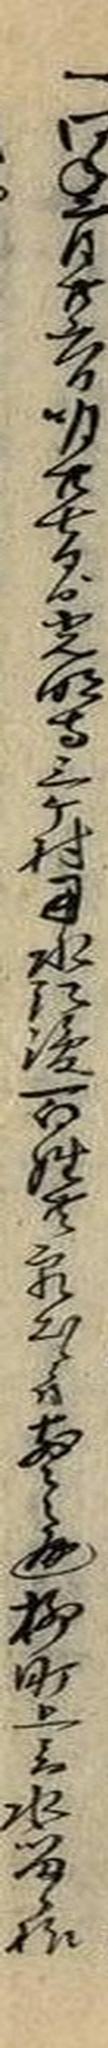一同年二月廿六日明廿七日ゟ光明寺三ケ村用水江浚百姓共願出候に付前々之通柳町上にて水留候様
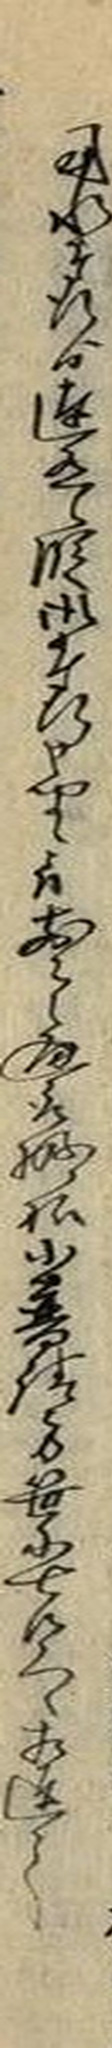用水奉行ゟ達有之段御奉行申聞候に付前々之通取扱候様小普請方笹木七左衛門へ相達之
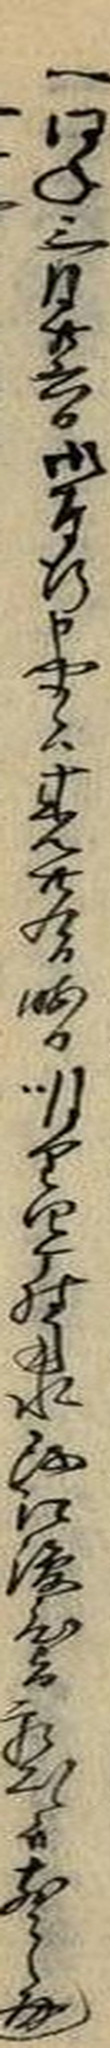一同年三月廿六日御奉行申聞候は来ル廿九日晦日明里四ケ村用水致江浚度旨願出候に付前々之通
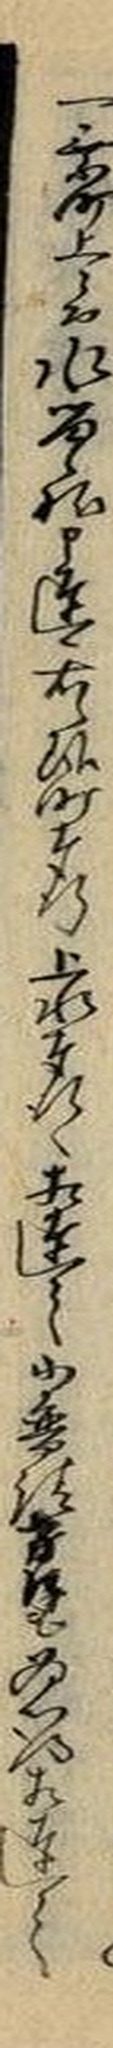一乗町上にて水留候様申達候右之趣町奉行上水奉行へ相達之小普請方えも為心得相達之
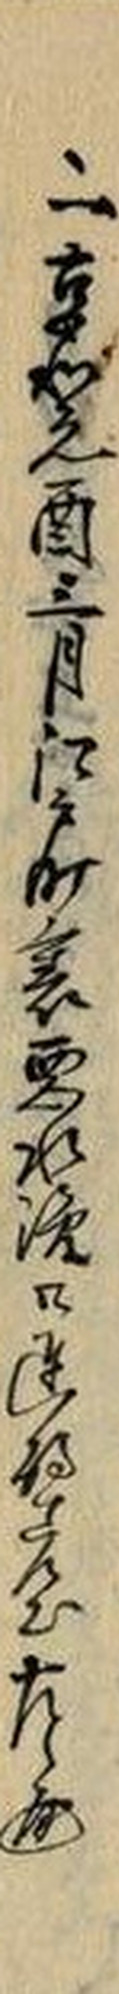一享和元酉三月江戸町裏悪水浚口達触差出左之通
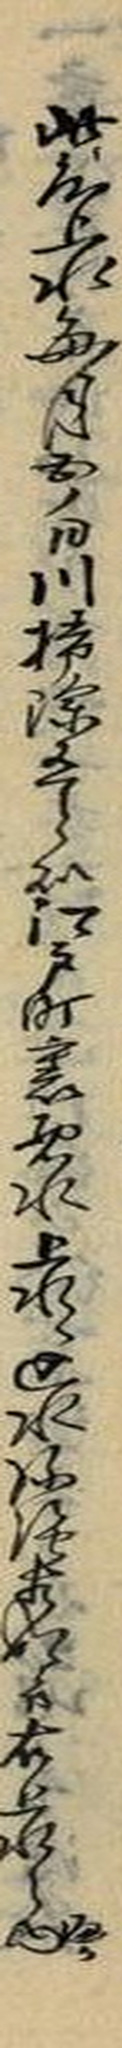此度上水毎月五ノ日川掃除有之候処江戸町裏悪水上水へ込水弥強相成候に付右上水之内
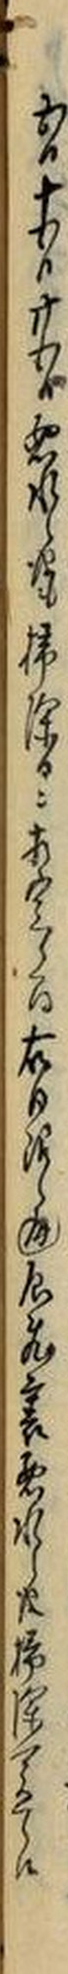五日十五日廿五日悪水之儀も掃除日に相定候間右日限之通屋敷裏悪水之儀掃除可有之候
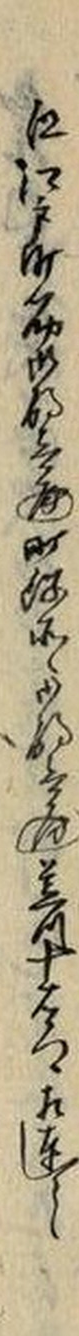但江戸町筋御触壱通町役所へ御触壱通荒川十右衛門へ相達之
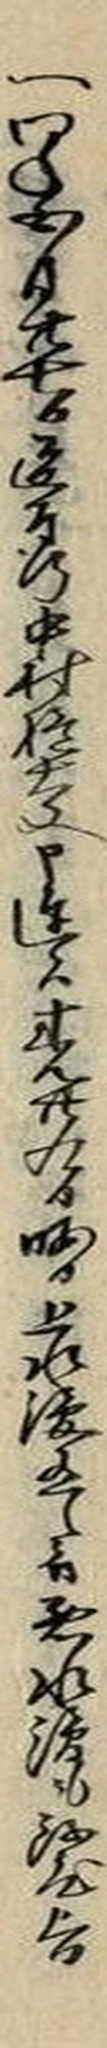一同年五月廿七日道奉行中村権大夫申達候は来ル廿九日晦日上水浚有之に付悪水浚も致度旨
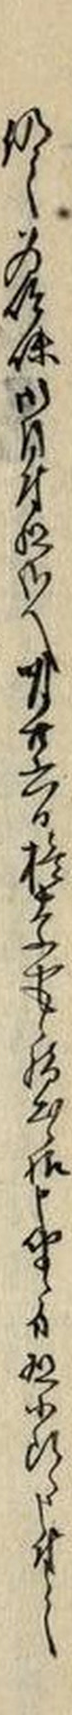仍之為吟味御目付組弐人明廿六日権大夫宅へ指出候様申聞候に付組小頭へ申付之
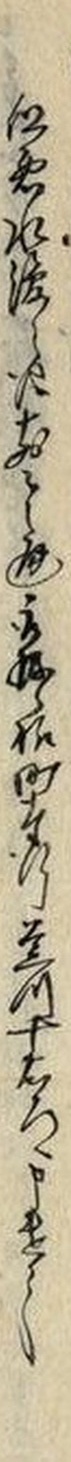但悪水浚之儀前々之通取扱候様町奉行荒川十右衛門へ申遣之
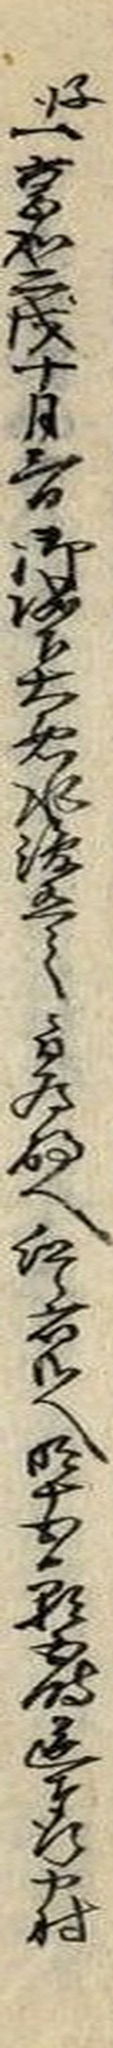後一享和二戌十月三日御城下大悪水浚有之に付為触人組之者弐人明十五日朝五時道奉行中村
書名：御城下諸事之部
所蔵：福井県文書館 Fukui Prefectural Archives
